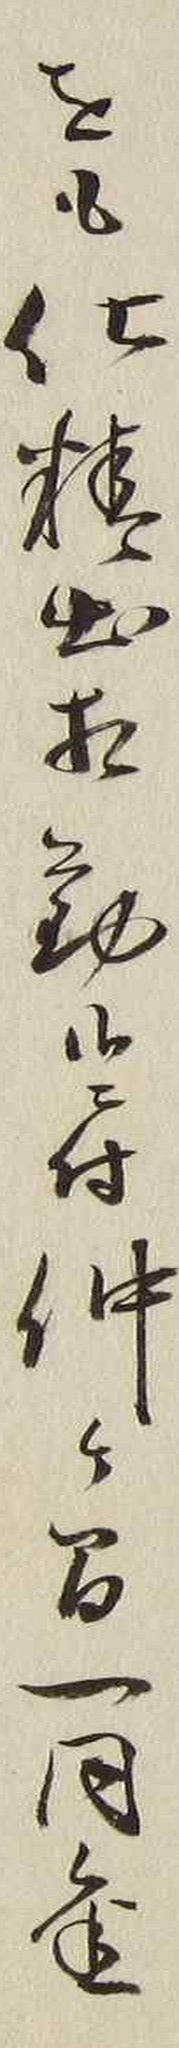をも仕精出相勤候ニ付仲ヶ間一同金
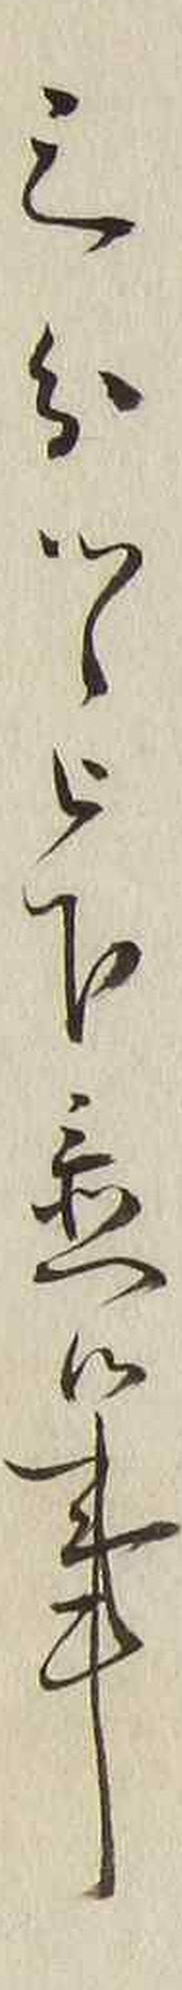三分ツヽ被下置候事

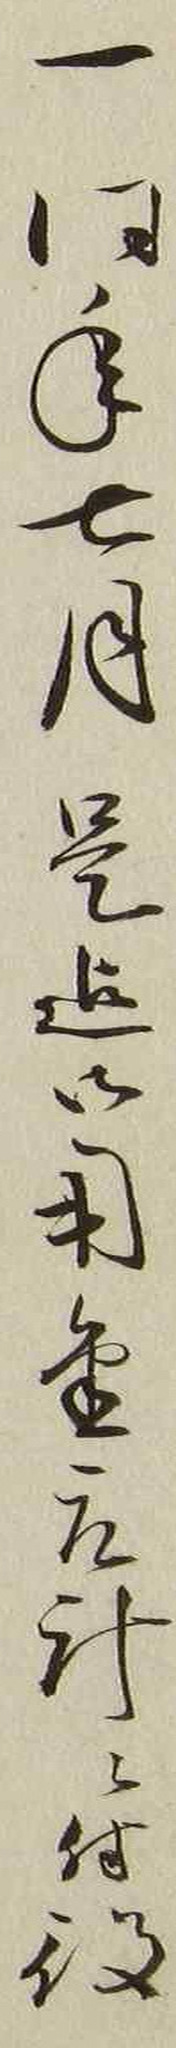一同年七月是迄御用金取計ニ付役
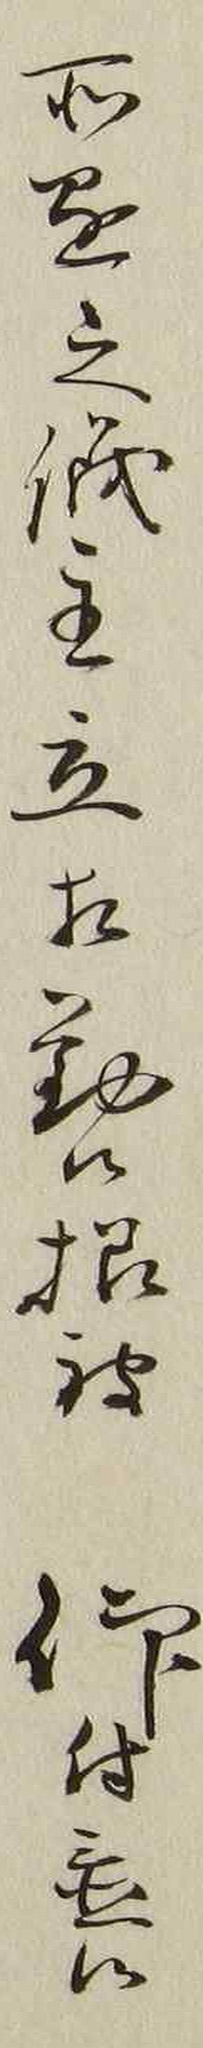所懸之儀主立相勤候様被仰付置候
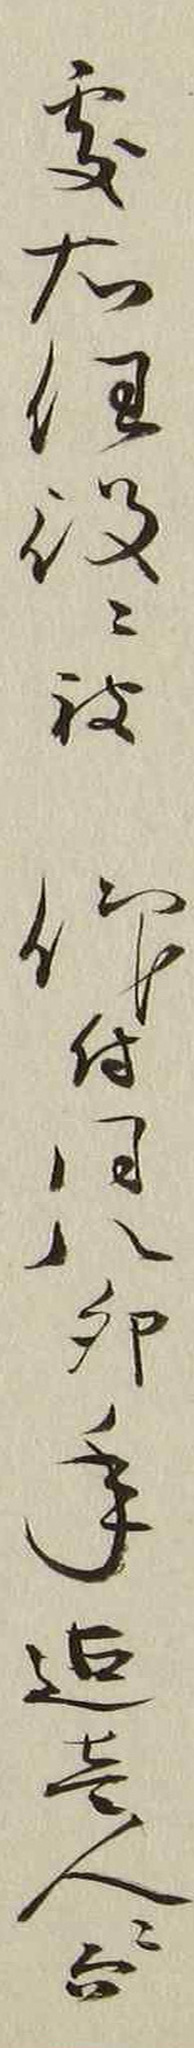処右任役ニ被仰付同八卯年迄壱人ニ而
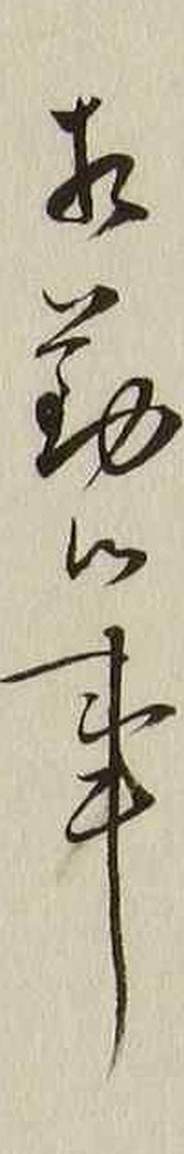相勤候事
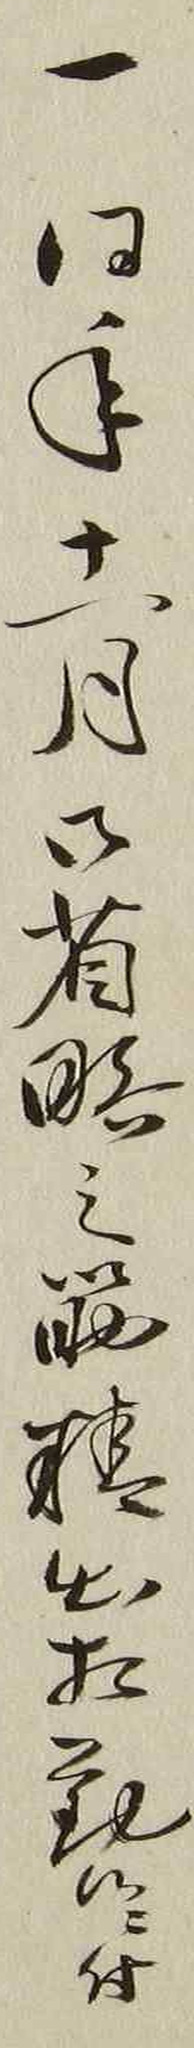一同年十一月御省略之筋精出相勤候ニ付
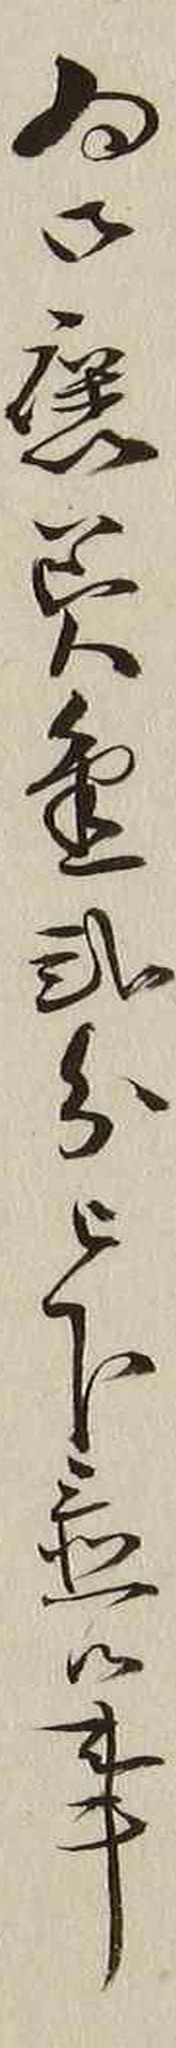為御褒美金弐分被下置候事
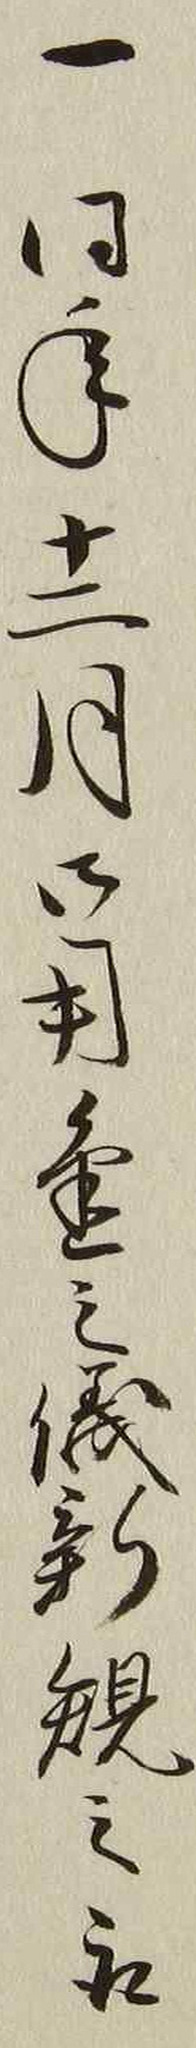一同年十二月御用金之儀新規之取
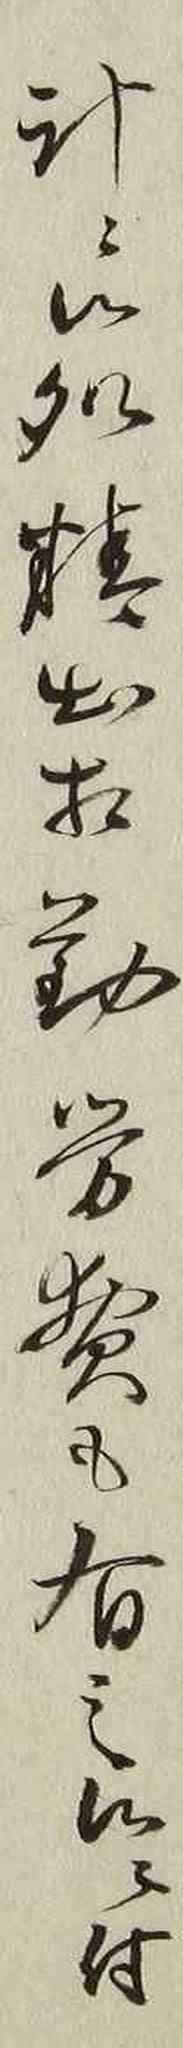計ニ候処精出相勤労費も有之候ニ付
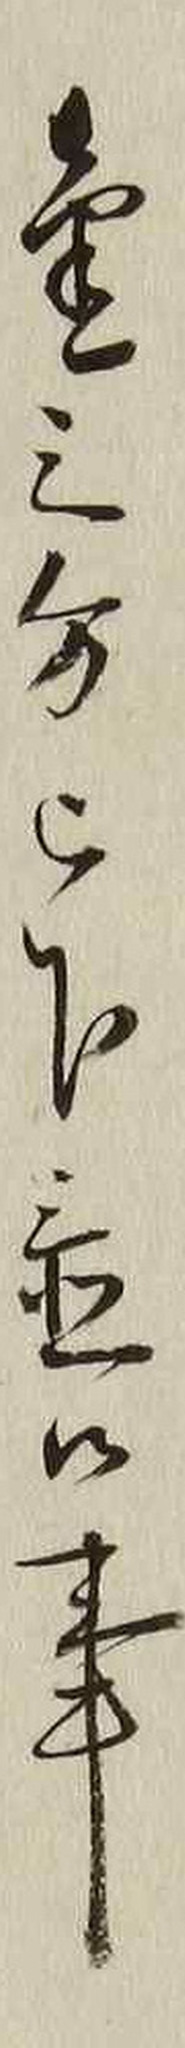金三分被下置候事
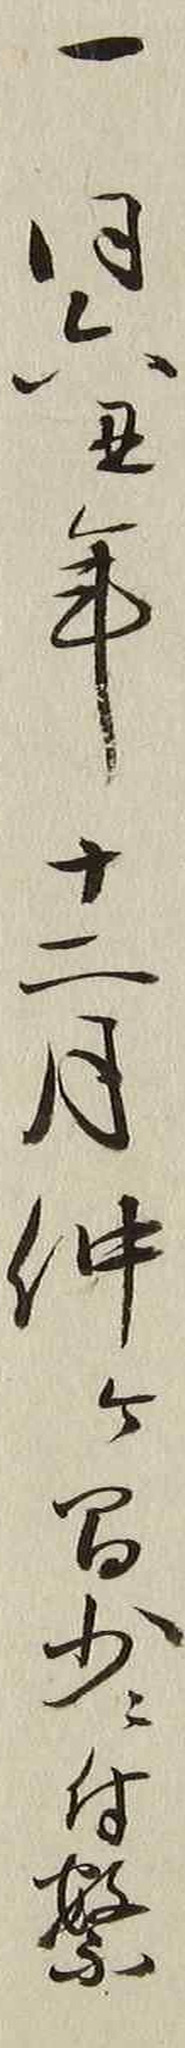一同六丑年十二月仲ヶ間少ニ付繫
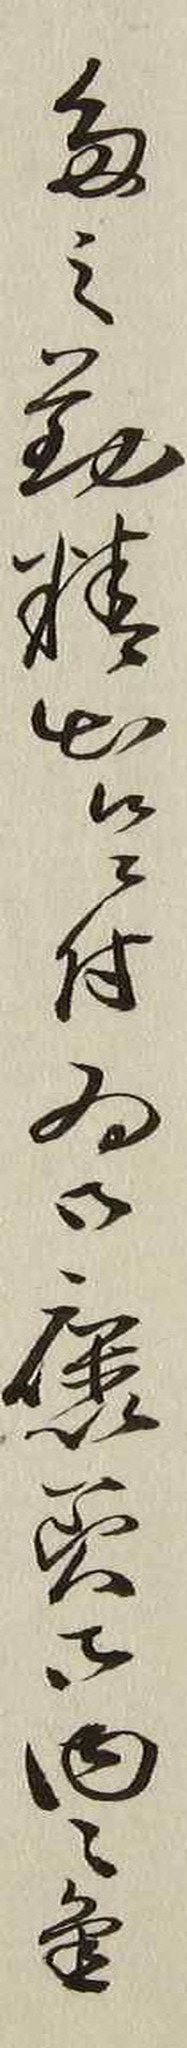多之勤精出候ニ付為御褒美御内々金
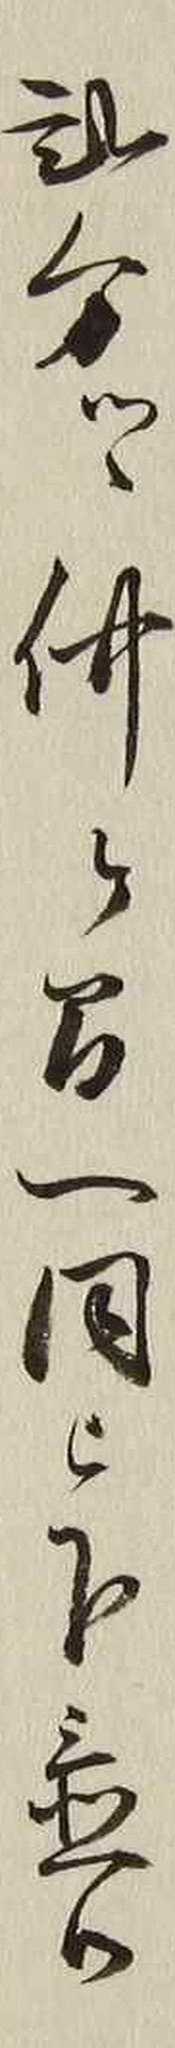弐分ツヽ仲ヶ間一同被下置候
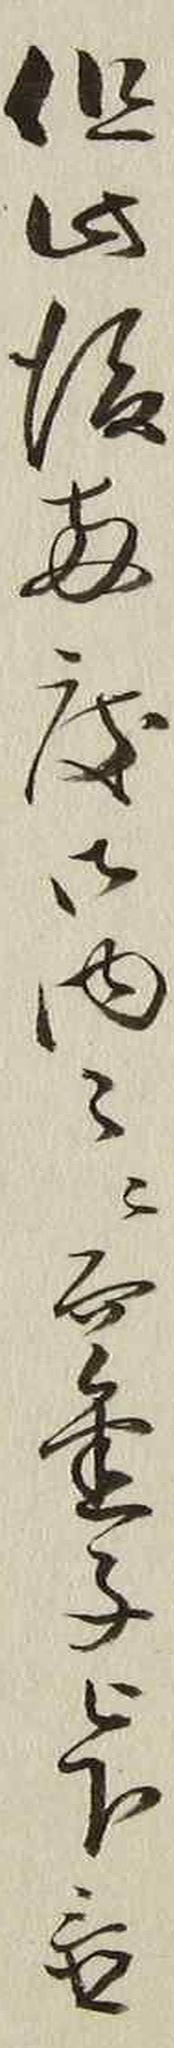但此後両度御内々ニ而金子被下置
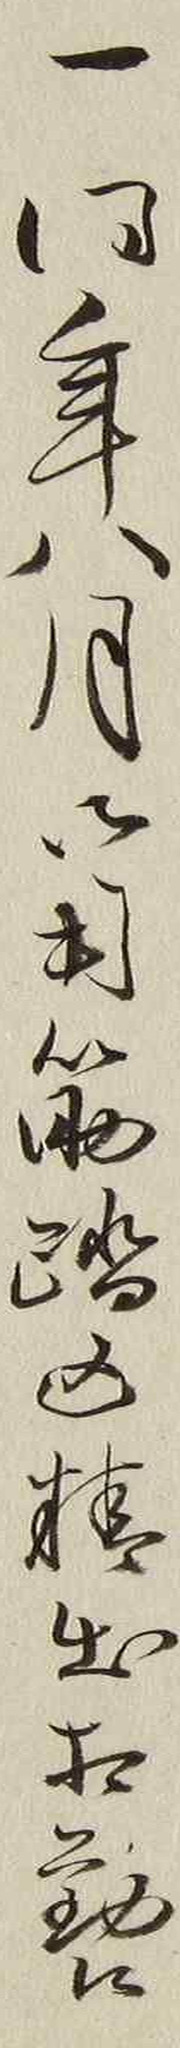一同年八月御用筋踏込精出相勤候
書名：諸士系譜　巻之163　な之部5
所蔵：会津若松市立会津図書館
